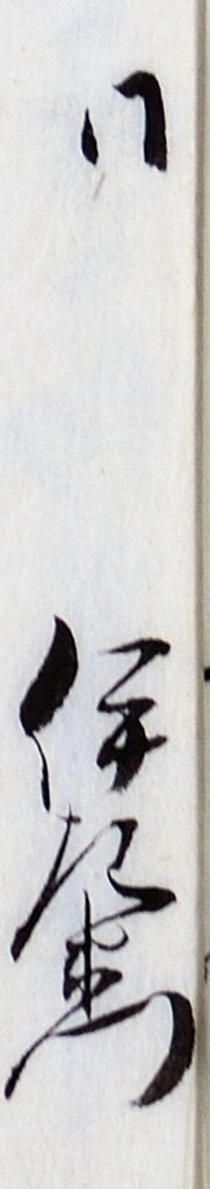同伊左衛門
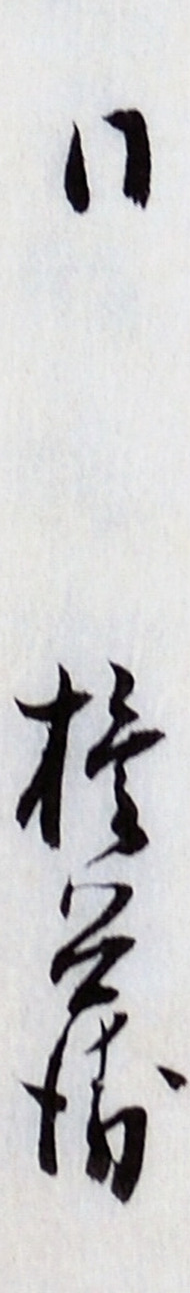同権兵衛
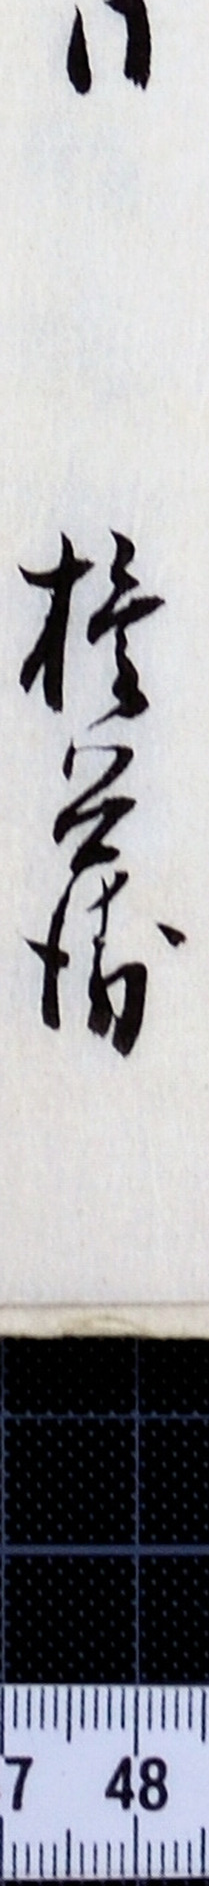同権兵衛
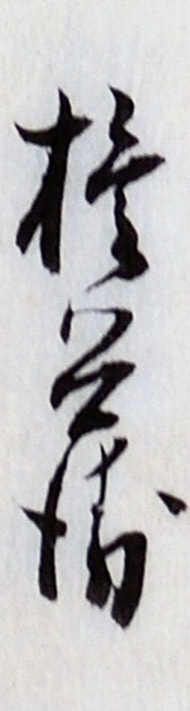同権兵衛
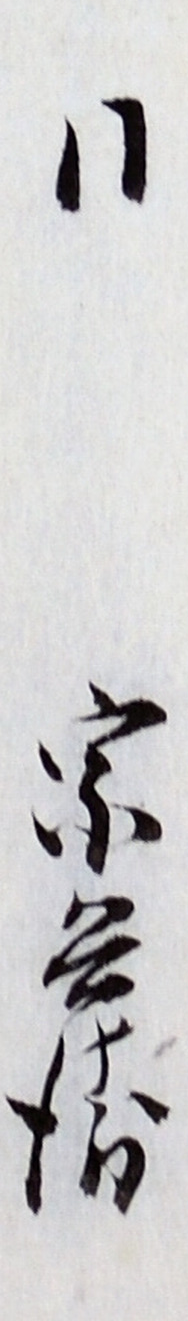同宗兵衛
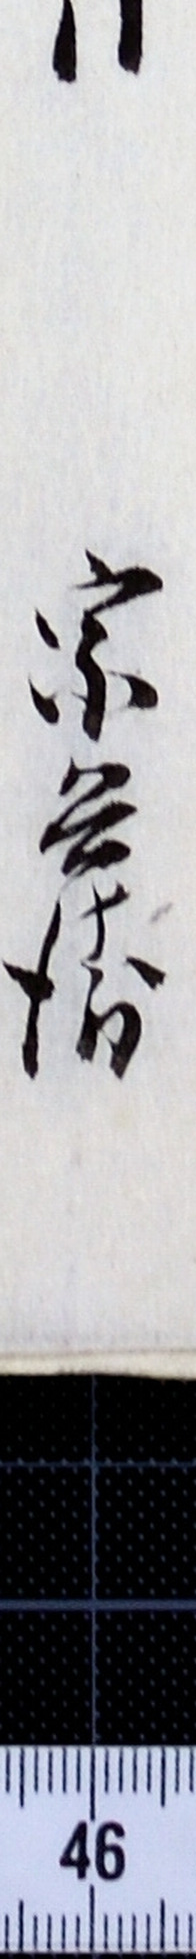同宗兵衛
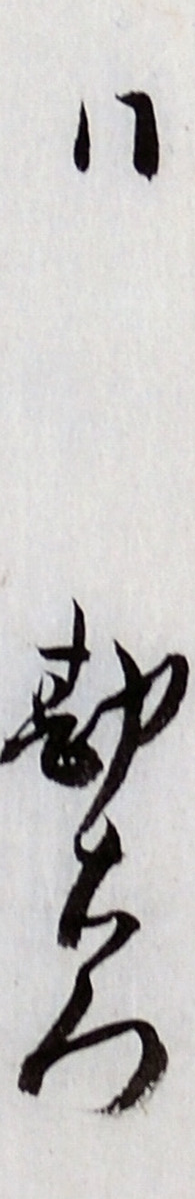同勘右衛門
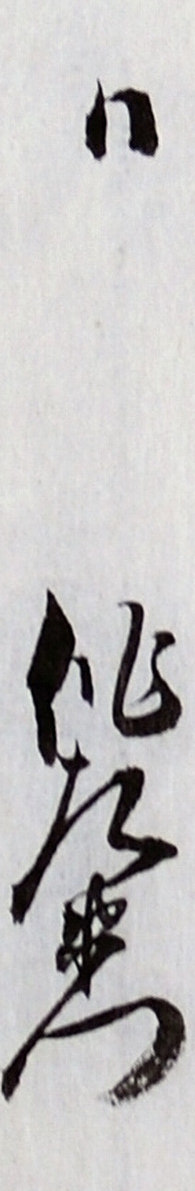同作左衛門
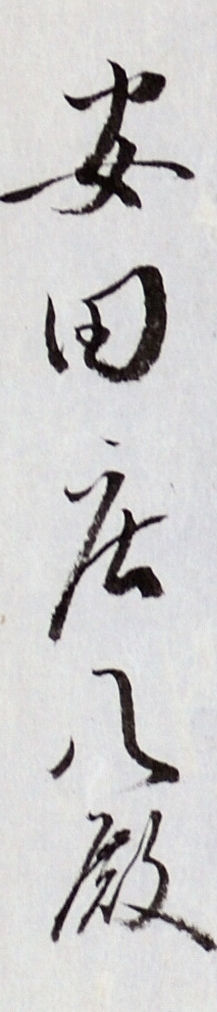安田庄八殿

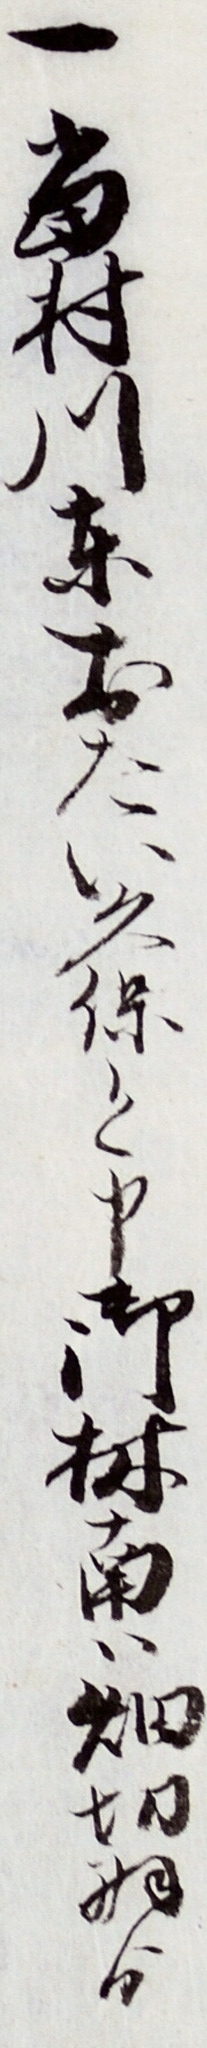一当村川東おたい久保と申御林南ハ畑切羽ゟ
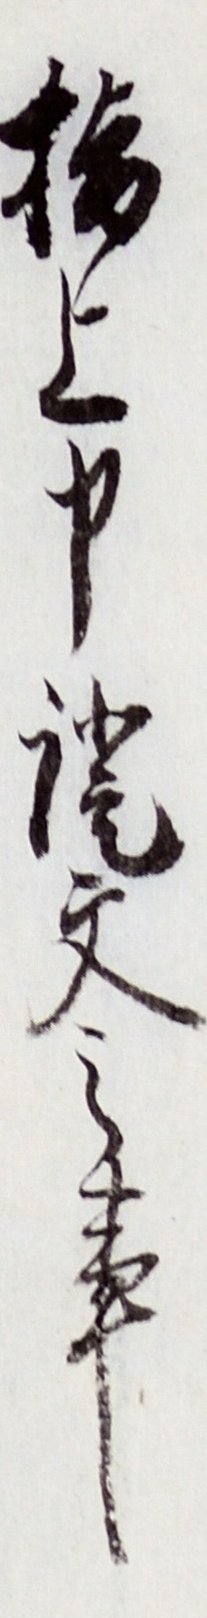指上申証文之事
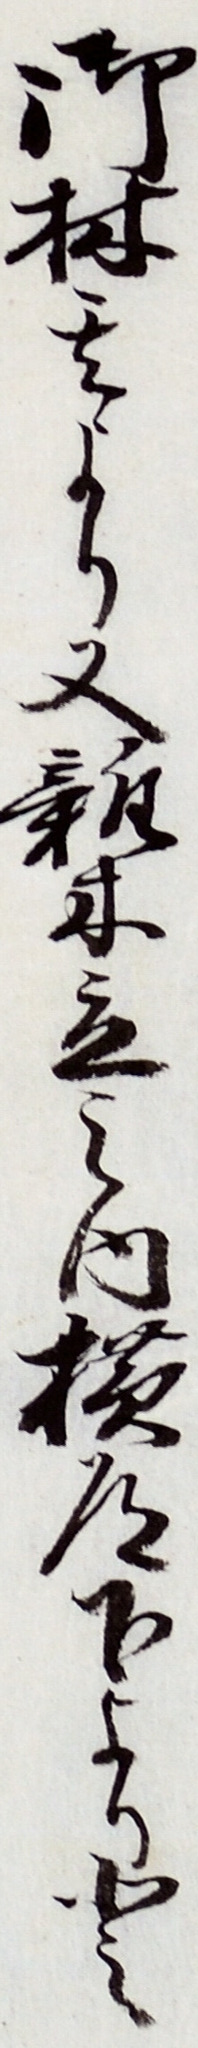御林其より又雑木立之内横道下よりと
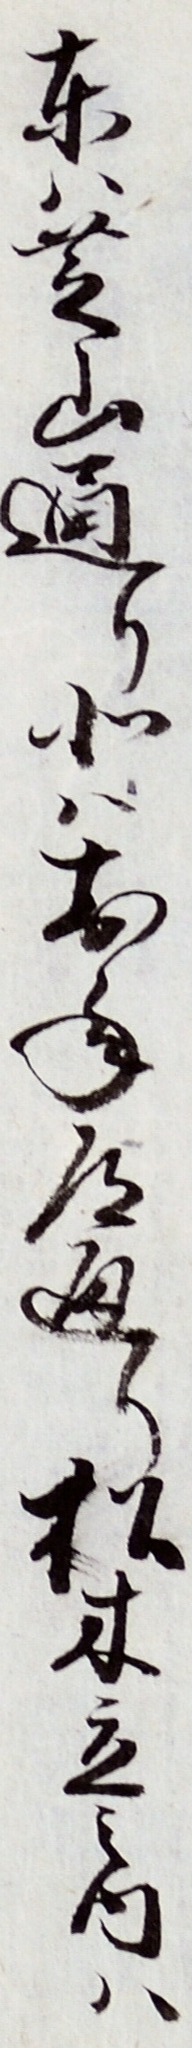東ハ芝山通り北ハおね道通り松木立之内ハ
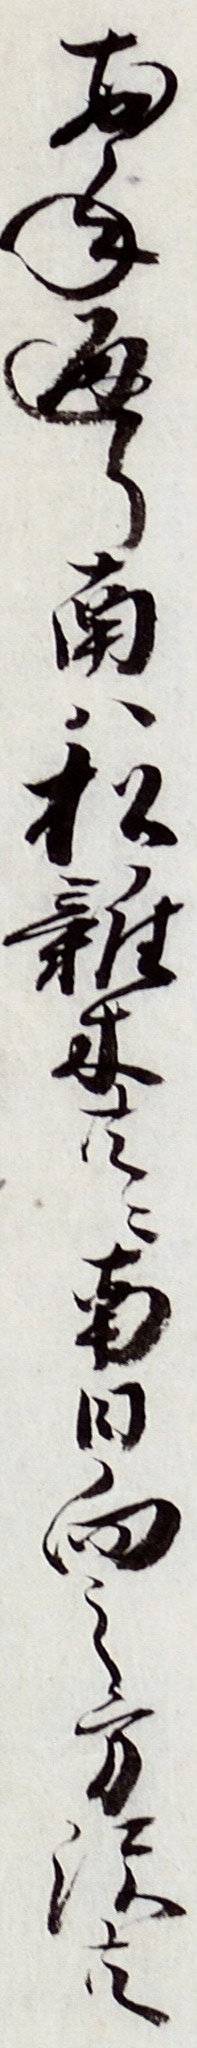おね通り南ハ松雑木共ニ南日向之方沢共
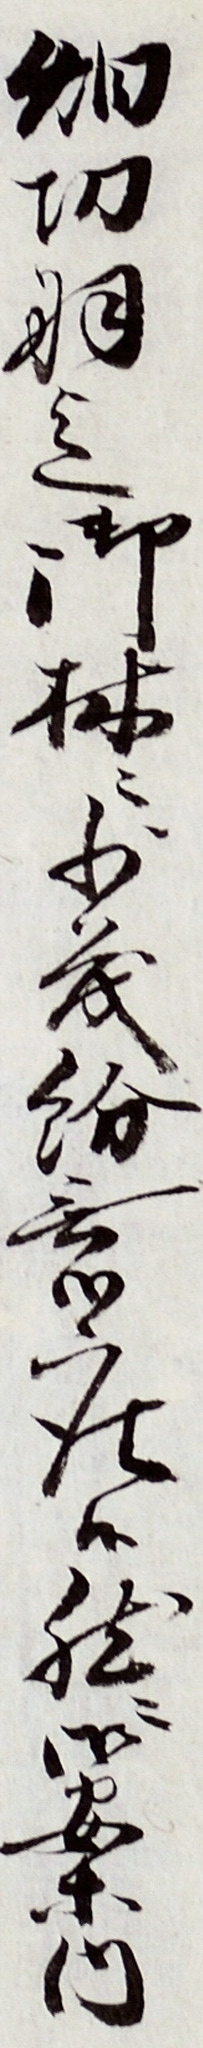畑切羽迄御林ニ少茂紛無御座候然ニ御案内
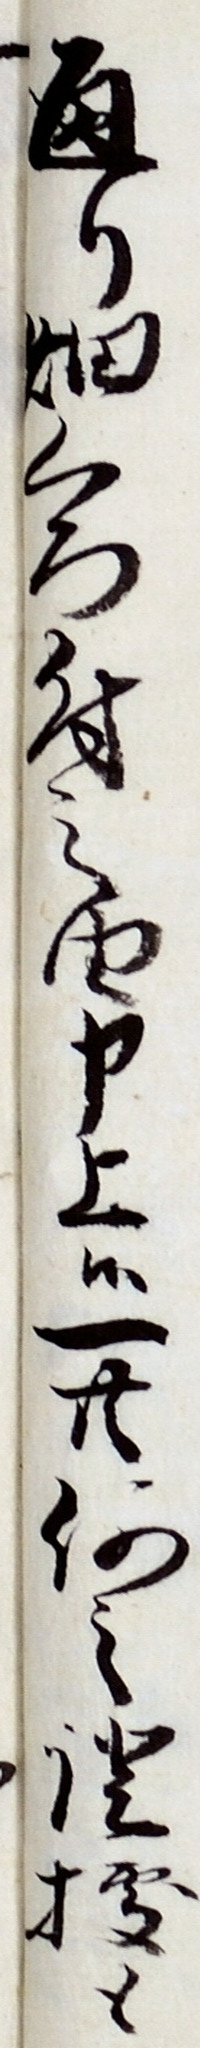通り畑くろ付之由伸申上候一共何之証拠も
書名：御林御竹藪証文控
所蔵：伊那市立高遠町図書館・合同会社AMANE
